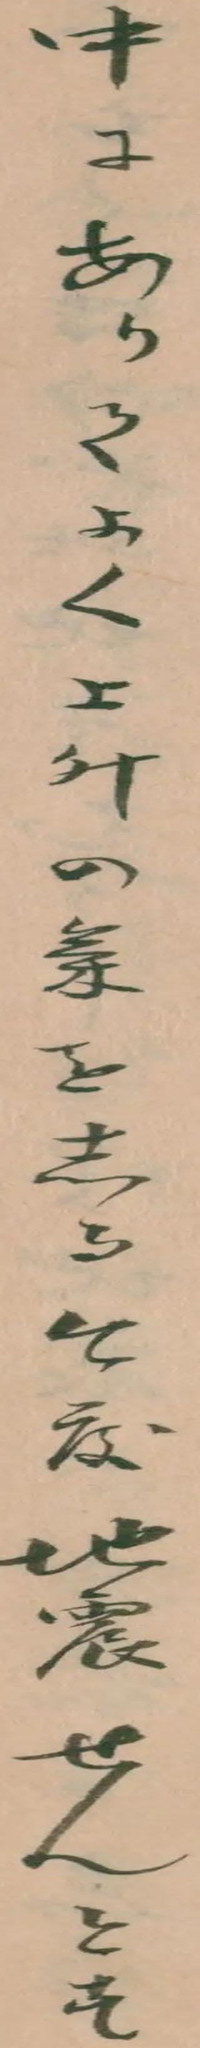中にありてよく上昇の気をしる今度地震せんとす
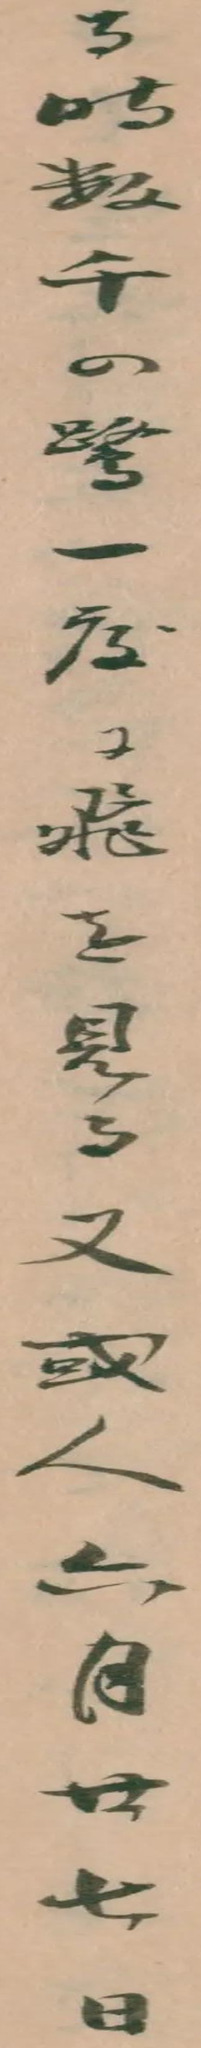る時数千の鷺一度に飛を見る又或人六月廿七日
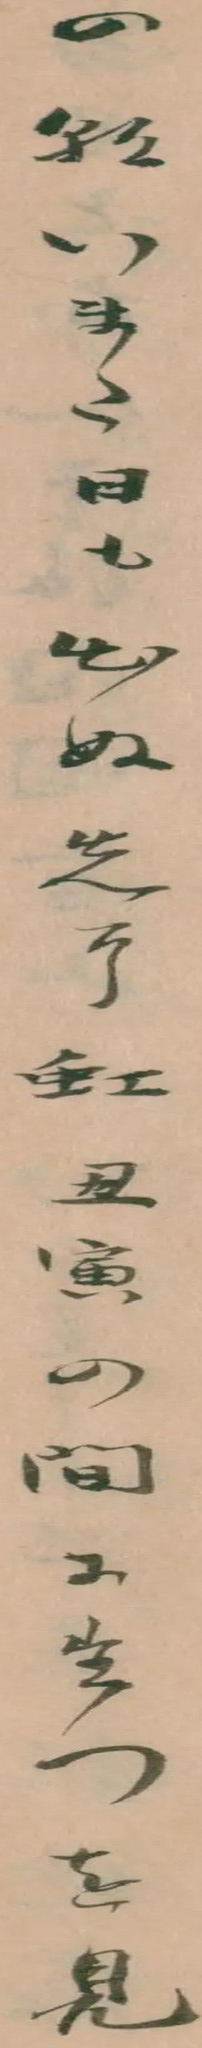の朝いまた日も出ぬ先に虹丑寅の間にたつを見
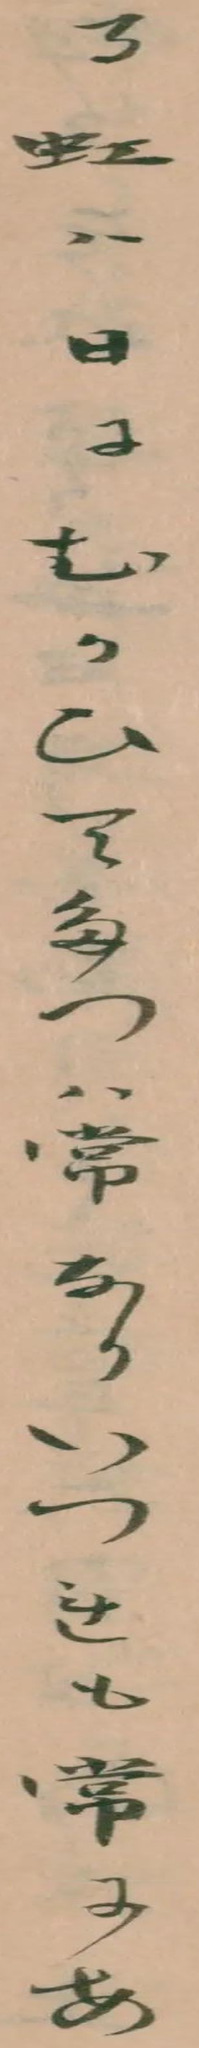る虹は日にむかひてたつは常なりいつれも常にあ
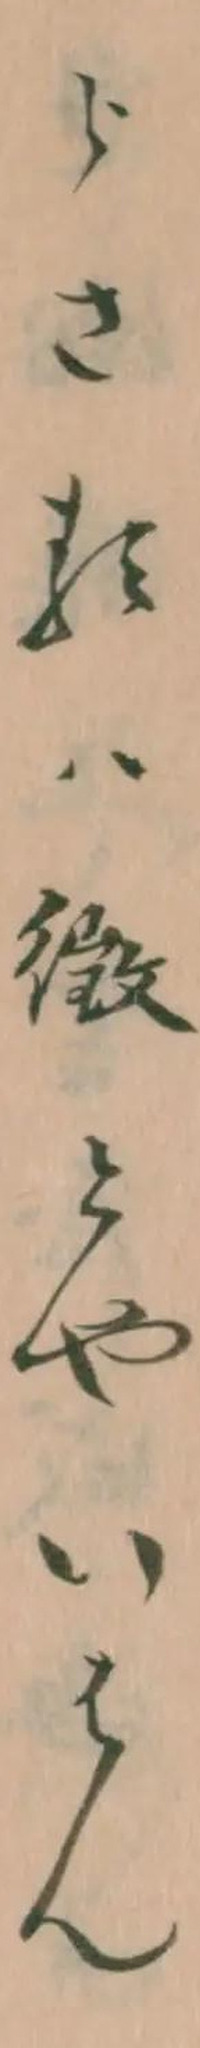らされは徴とやいはん
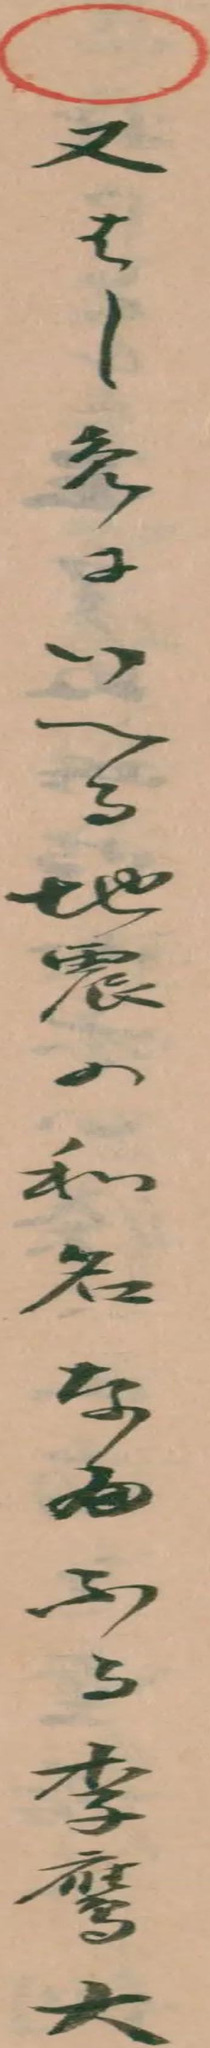〇又はしめにいへる地震の和名なゐふる季鷹大
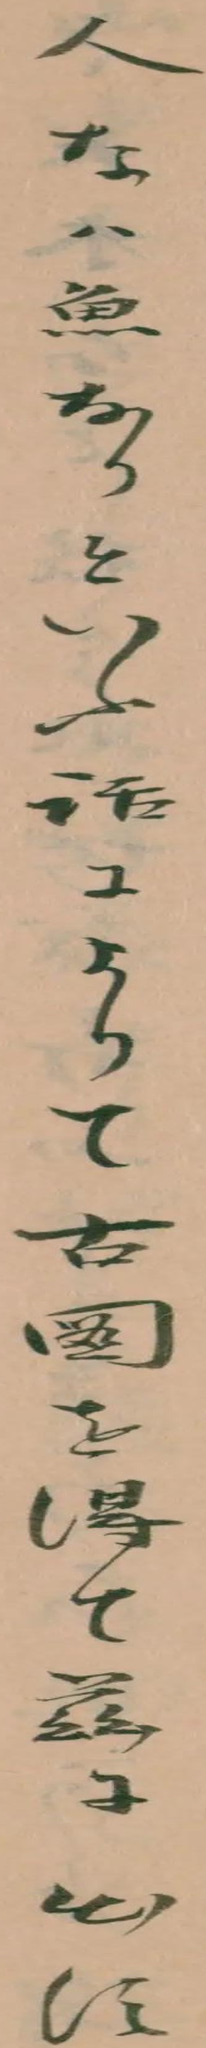人なは魚なりといふ話によりて古図を得て茲に出す
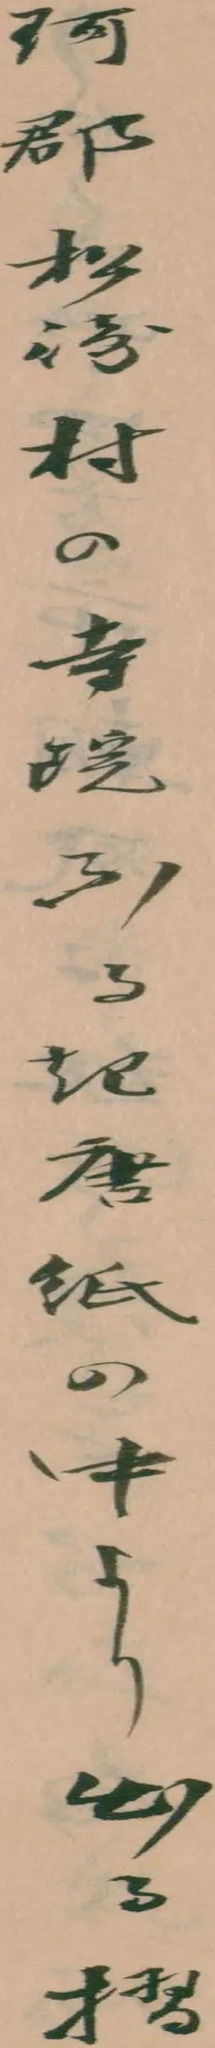珂郡松崎村の寺院ふるき唐紙の中より出る摺
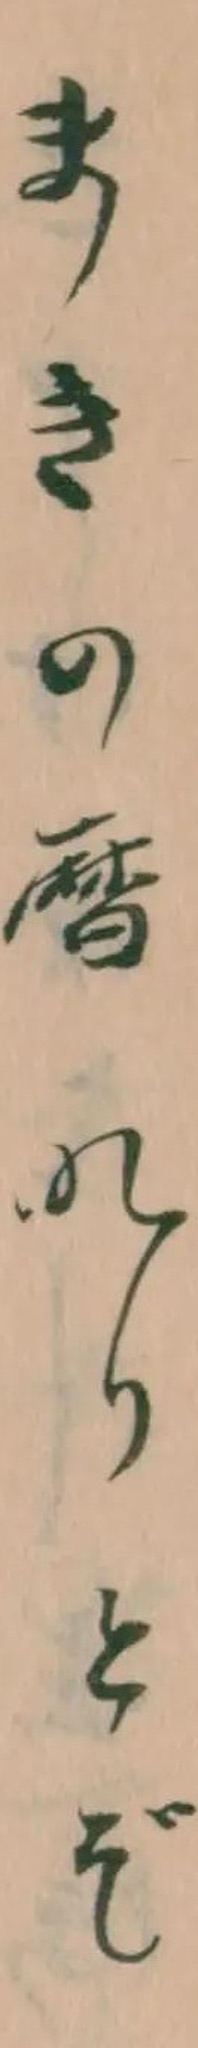まきの暦なりとぞ

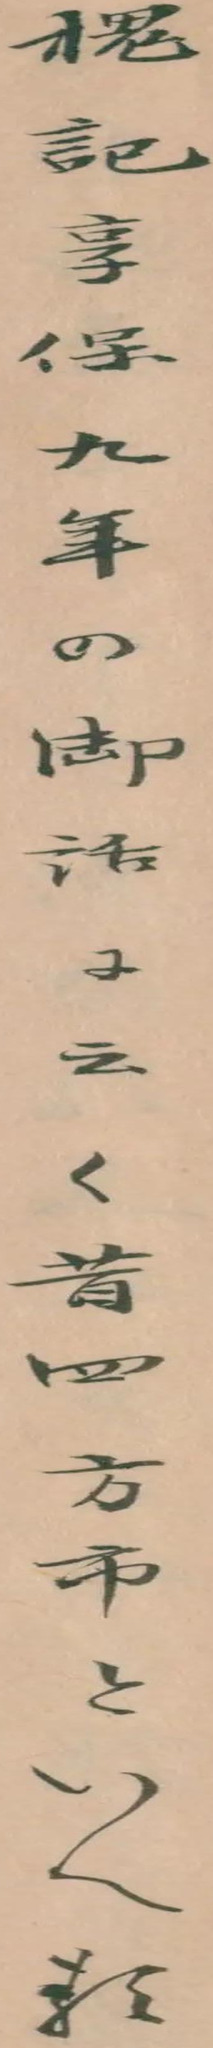槐記享保九年の御話に云く昔四方市といへる
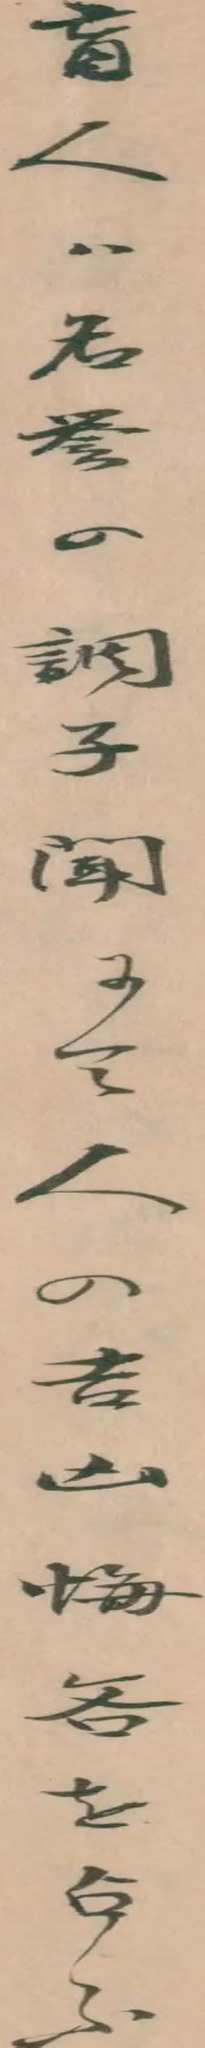盲人は名誉の調子聞にて人の吉凶悔吝を占ふ
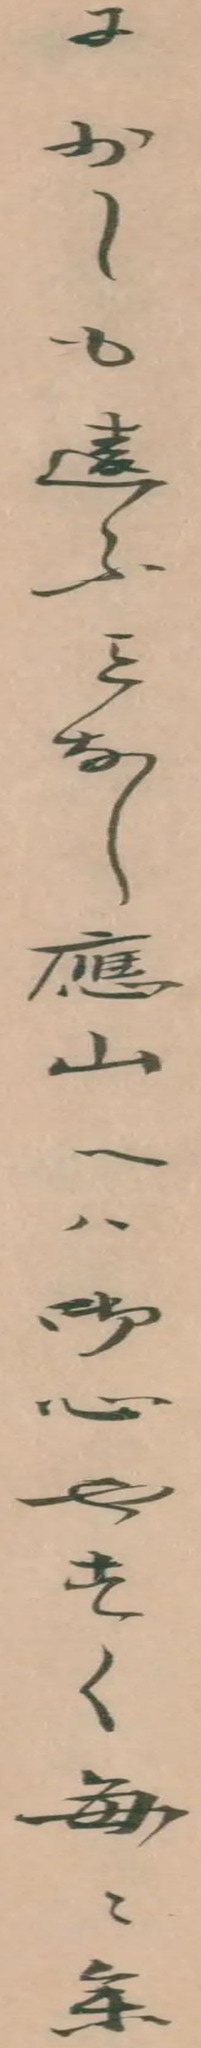に少しも違ふことなし応山へは御心やすく毎々参
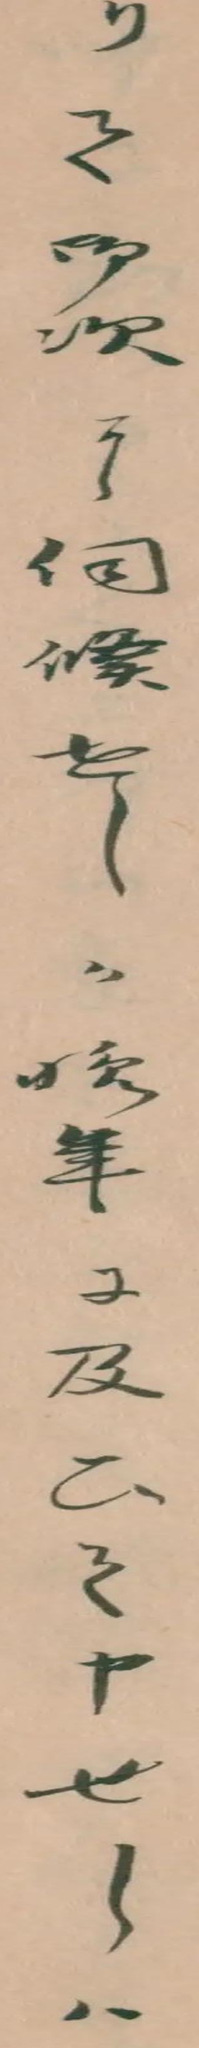りて御次に伺候せしか晩年に及ひて申せしは
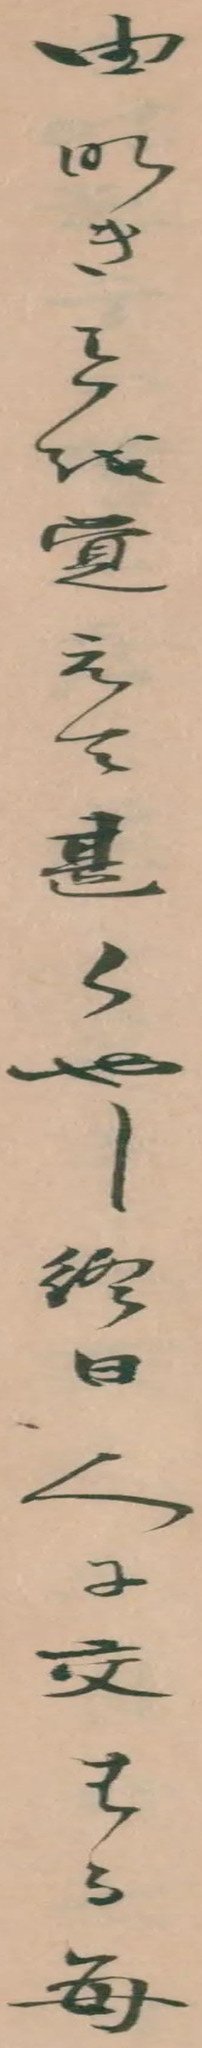由なきことを覚えて甚くやし終日人に交はる毎
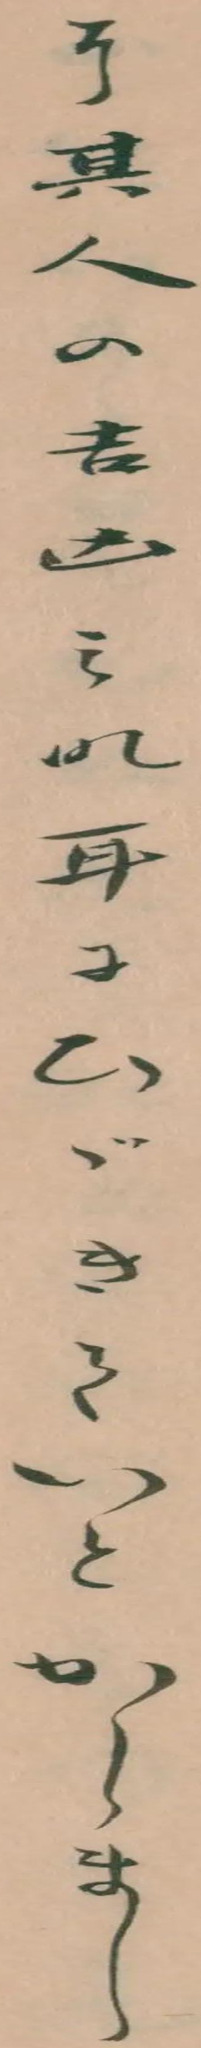に其人の吉凶みな耳にひゞきていとかしまし
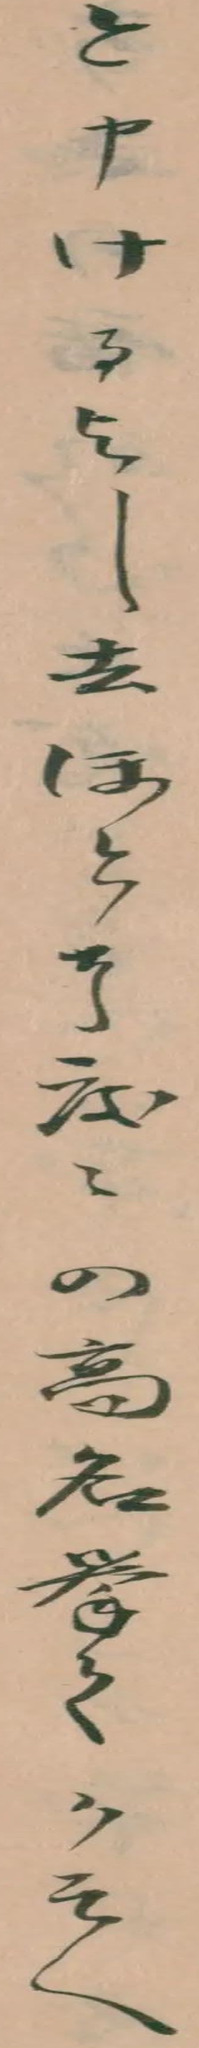と申けるよし去ほとに度々の高名挙てかそへ
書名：地災撮要. 巻5-6(地震之部)
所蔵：国立国会図書館 National Diet Library, JAPAN
